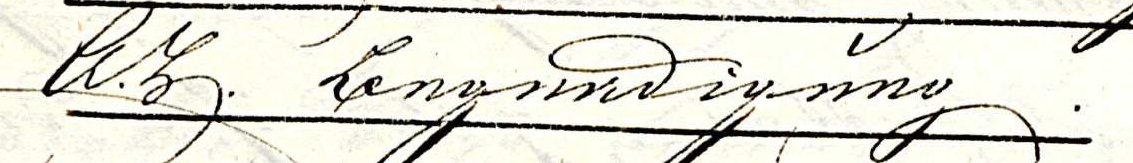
Ah. Begnadigung
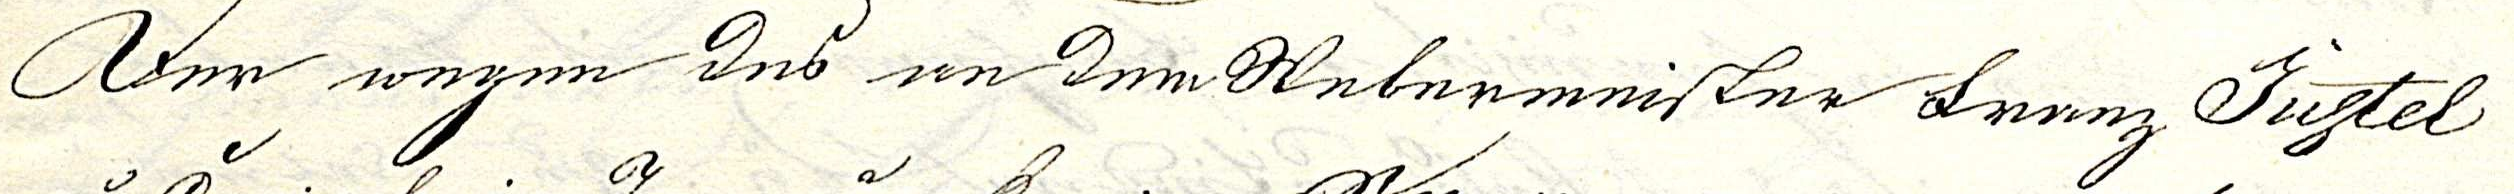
Der wegen des an dem Webermeister Franz Jüstel
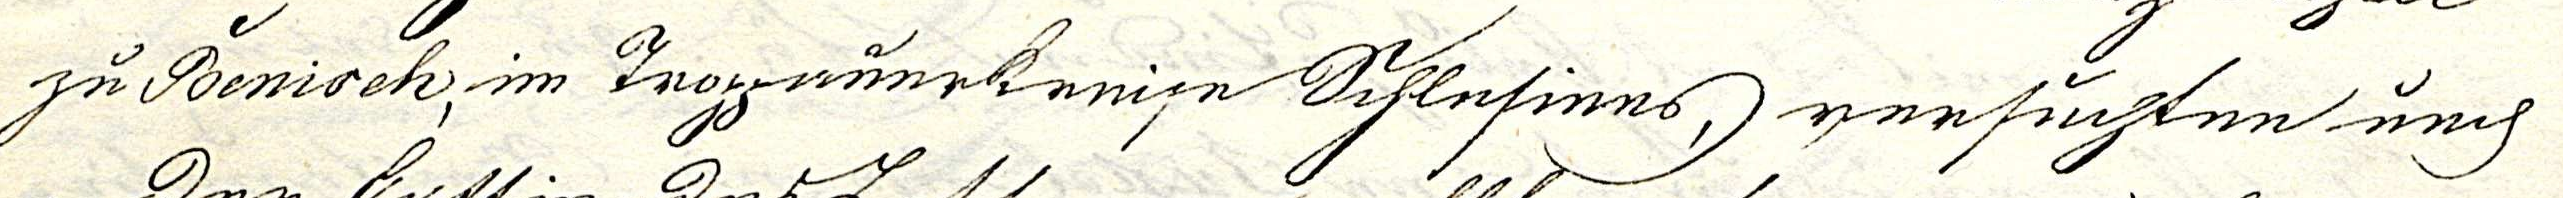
zu Benisch, im Troppauerkreise Schlesiens, versuchten auch
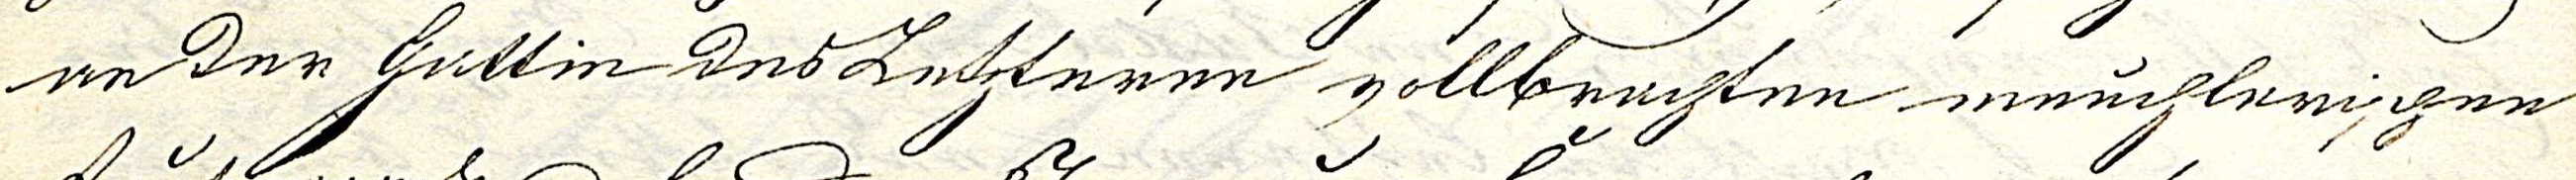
an den Gattin des Letzteren vollbrachten meuchlerischen
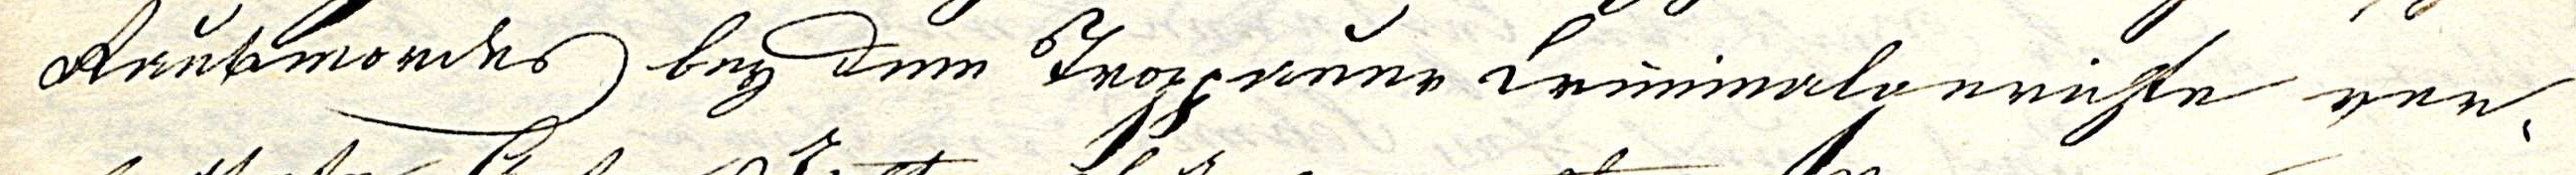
Raubmordes bey dem Troppauer Criminalgerichte ver¬
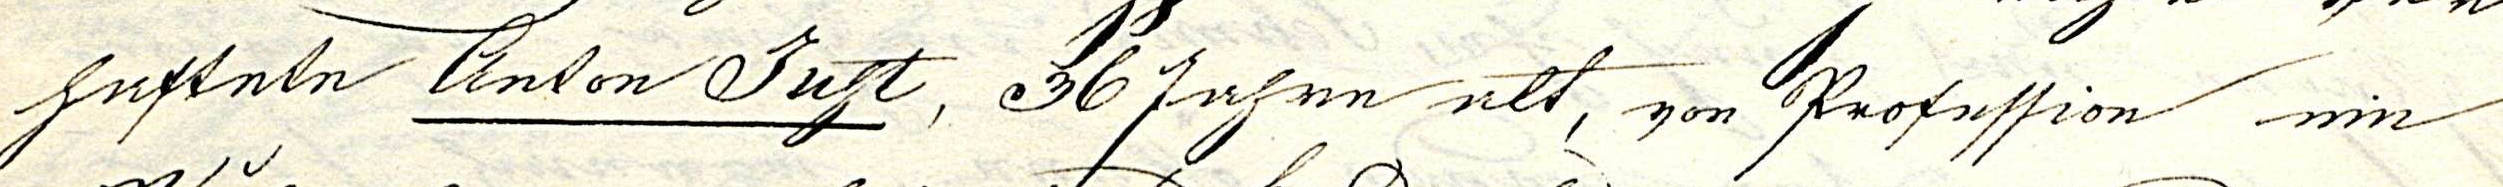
haftete Anton Just, 36 Jahre alt, von Profession ein
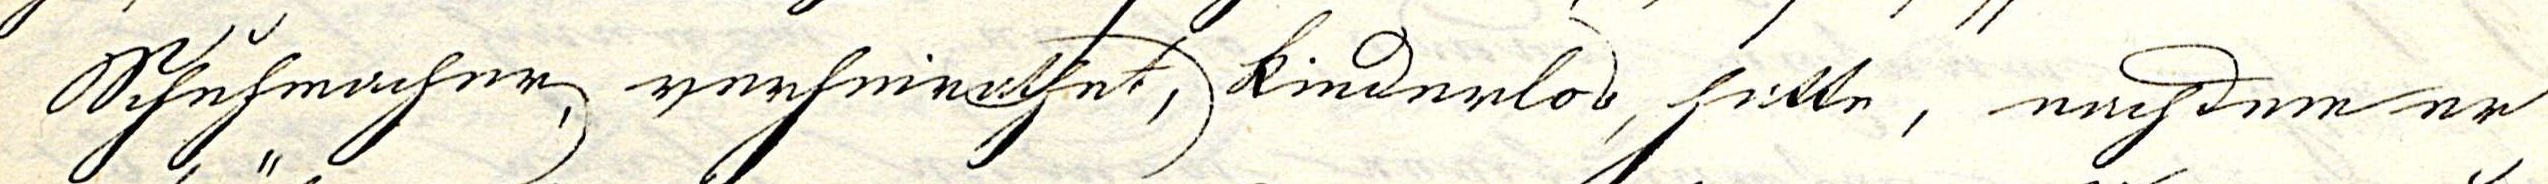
Schuhmacher, verheirathet, kinderlos, hatte, nachdem er
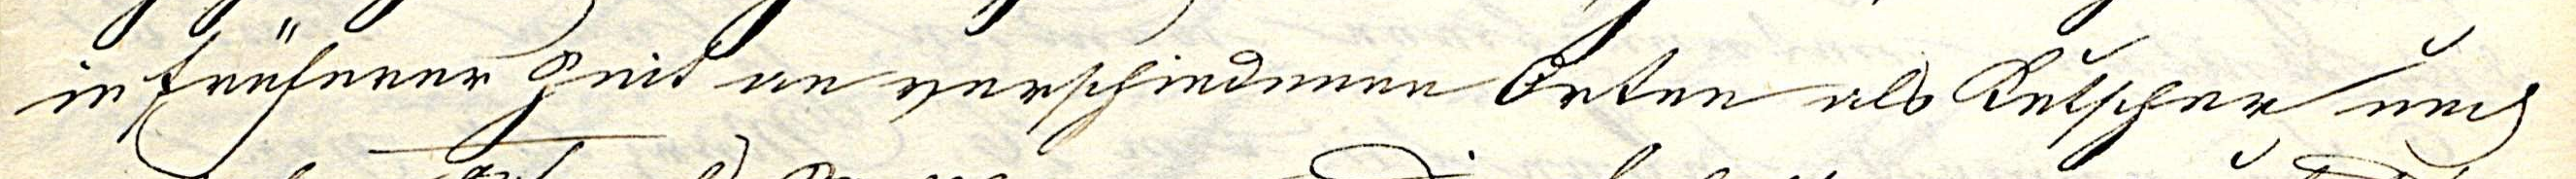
in früherer Zeit an verschiedenen Orten als Kutscher auch
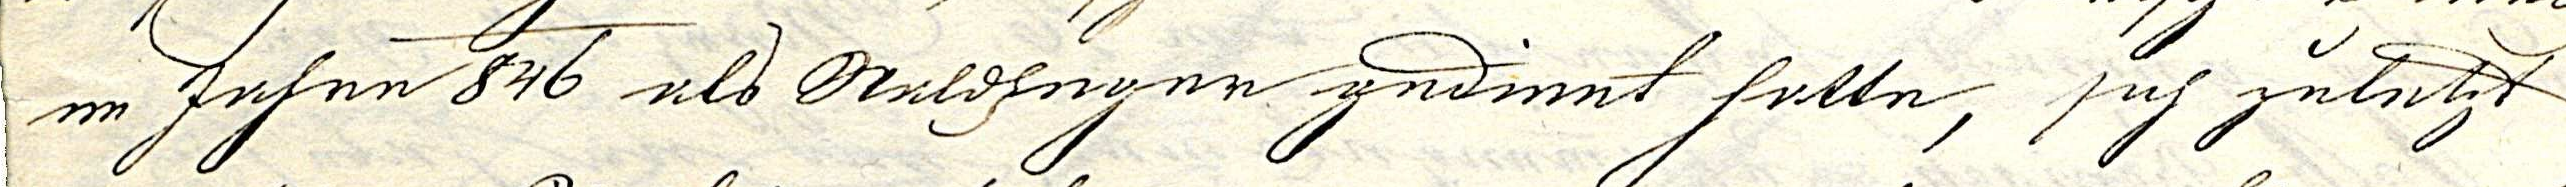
im Jahre 1846 als Waldheger gedient hatte, sich zuletzt
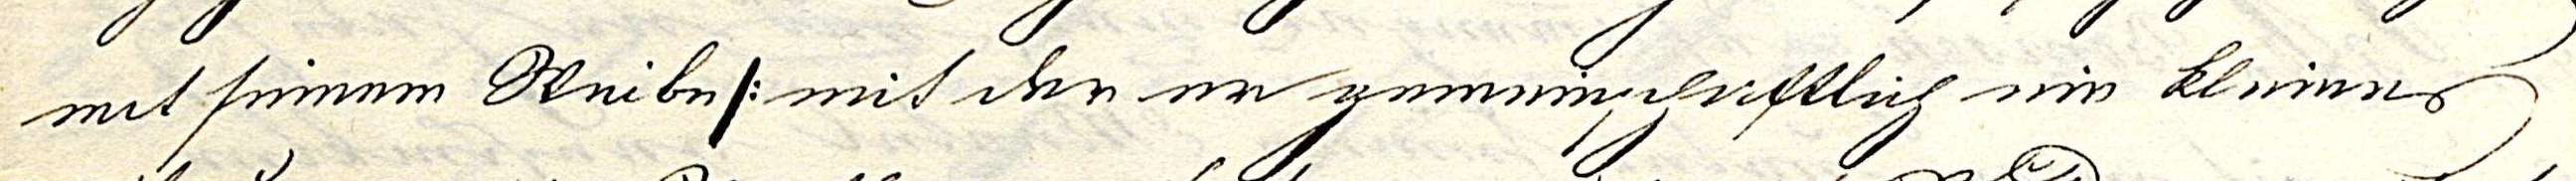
mit seinem Weibe (mit der er gemeinschaftlich ein kleines
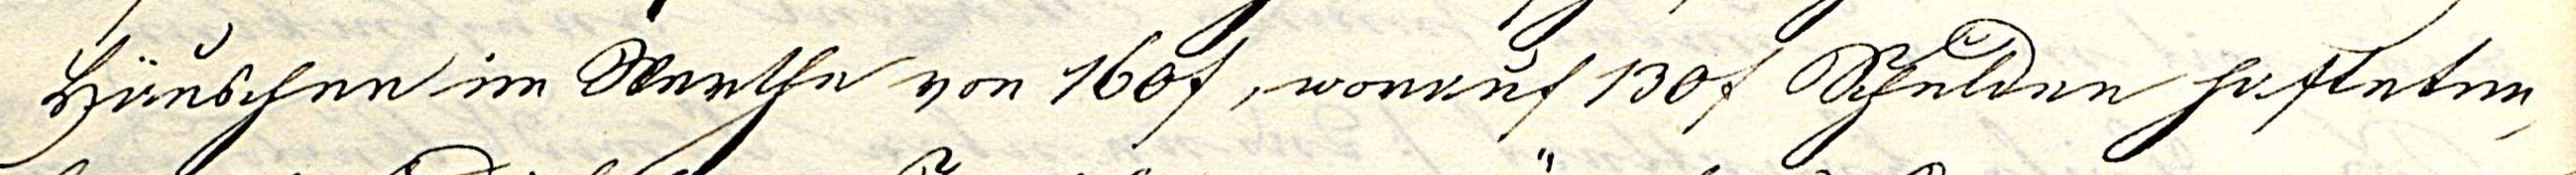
Häschen im Werthe vom 160f, worauf 130f Schulden hefteten
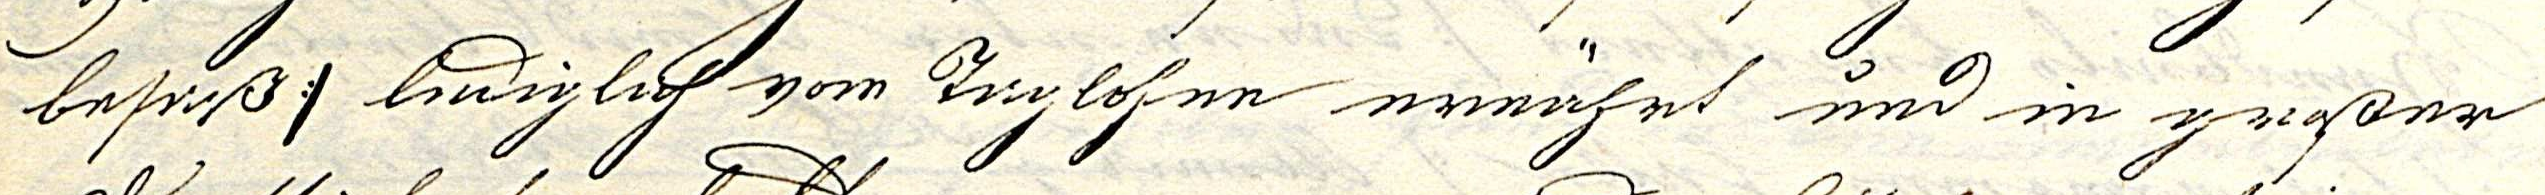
besaß) lediglich vom Taglohne ernährt und in großer
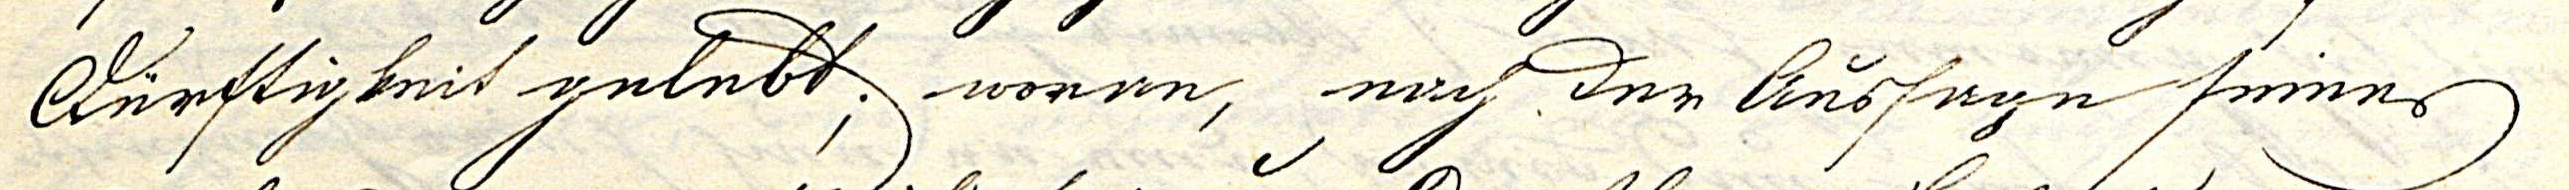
Dürftigkeit gelebt; woran, nach der Aussage seines
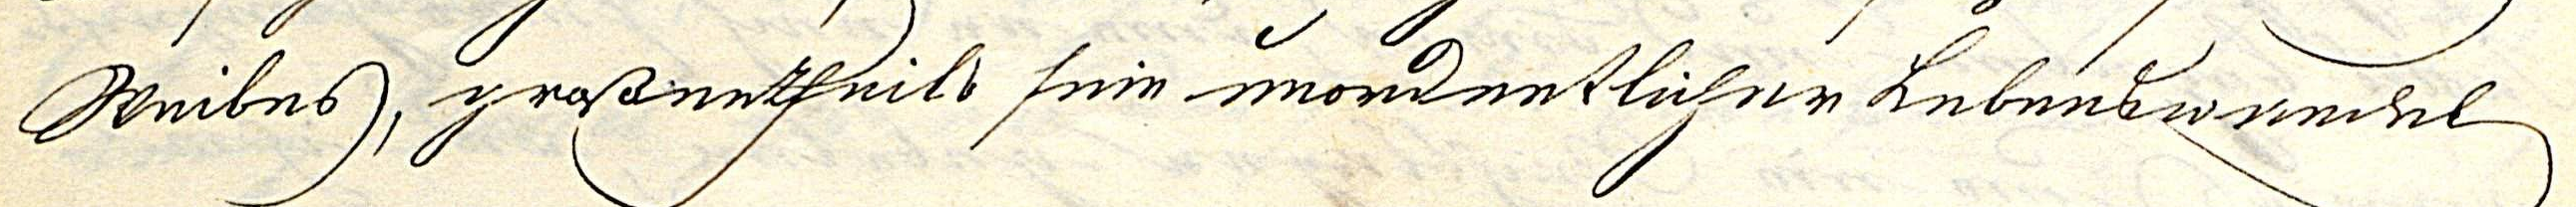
Weibes, großentheils sein unordentlicher Lebenswandel
